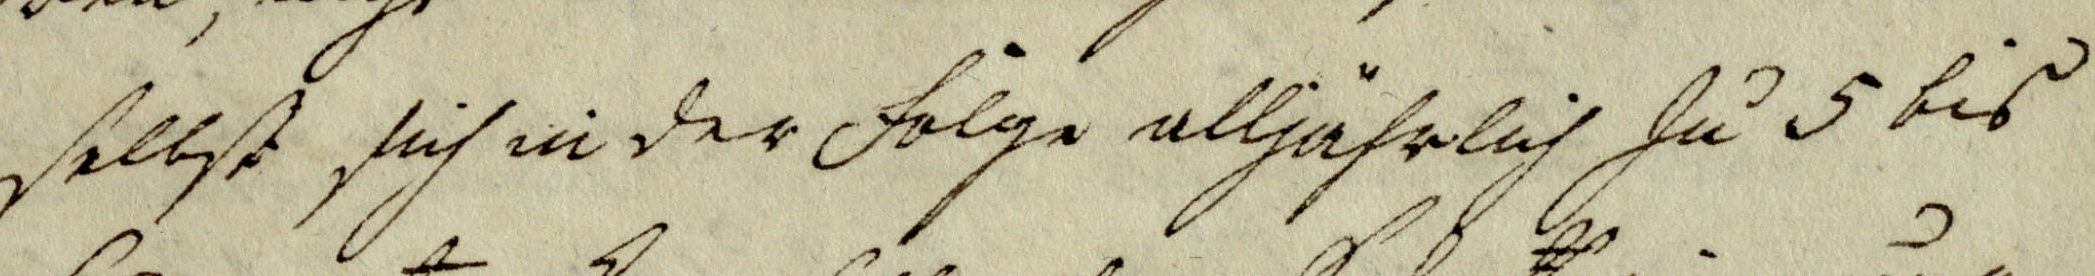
selbst sich in der Folge alljährlich zu 5 bis
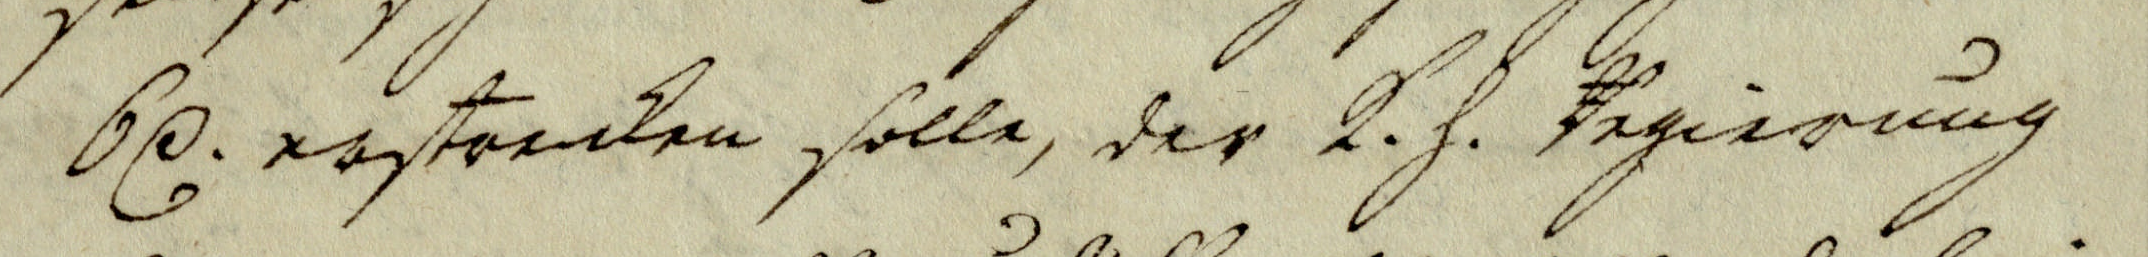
6 l. erstrecken solle, der K. H. Regierung
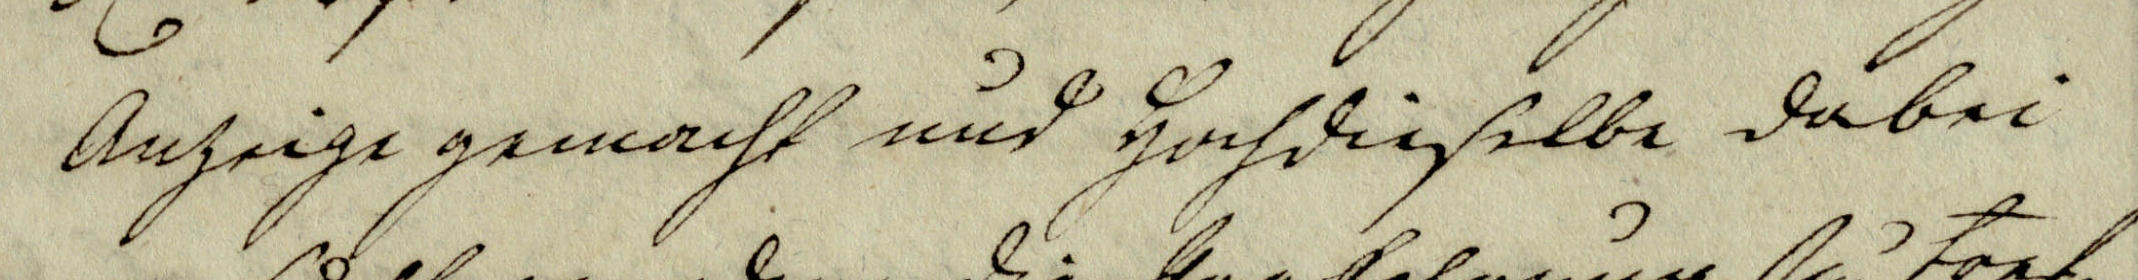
Anzeige gemacht und Hochdieselbe dabei
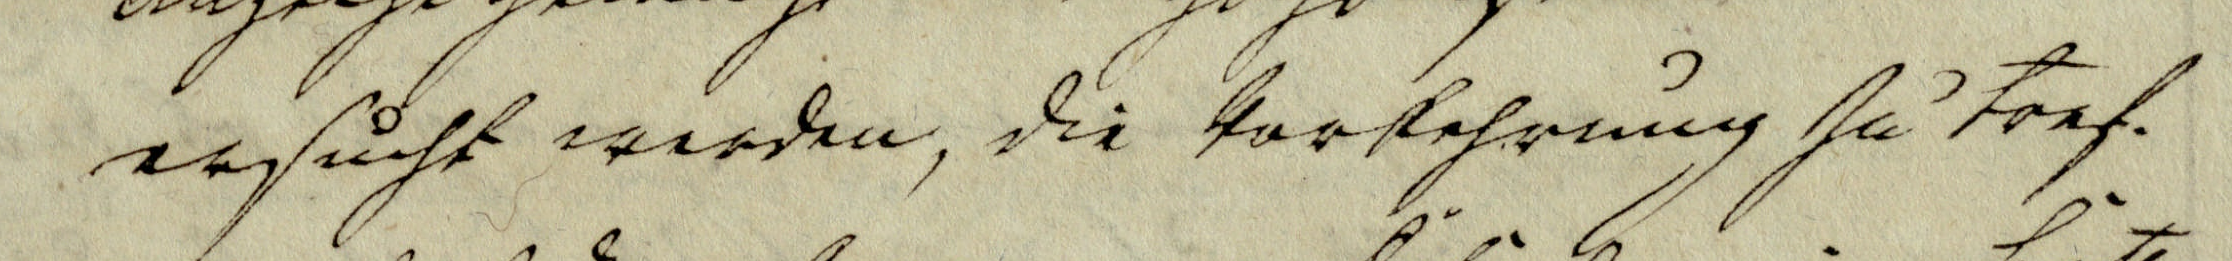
ersucht werden, die Vorkehrung zu tref¬
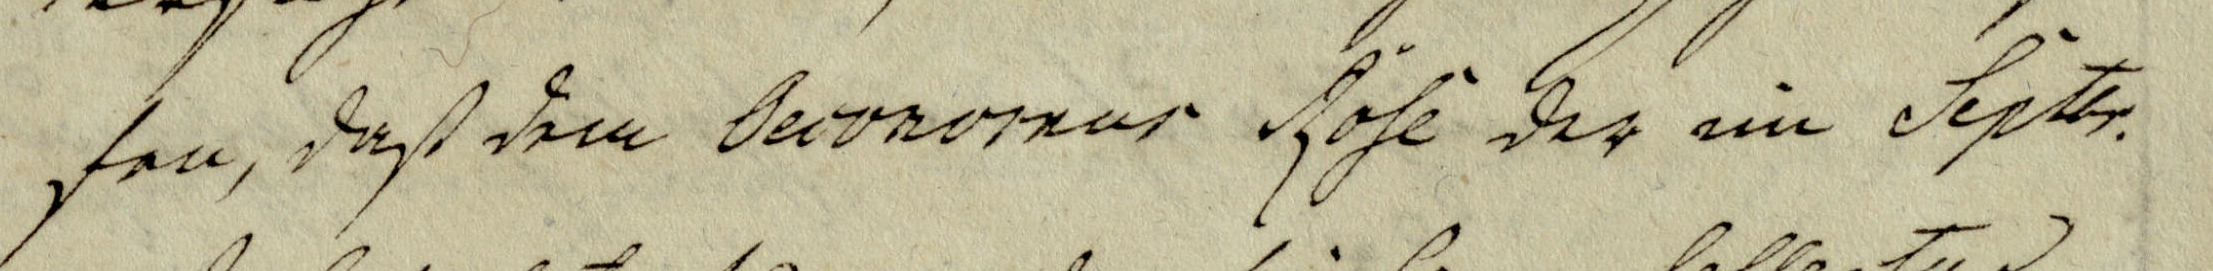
fen, daß dem Oeconomus Röse der im Septbr.
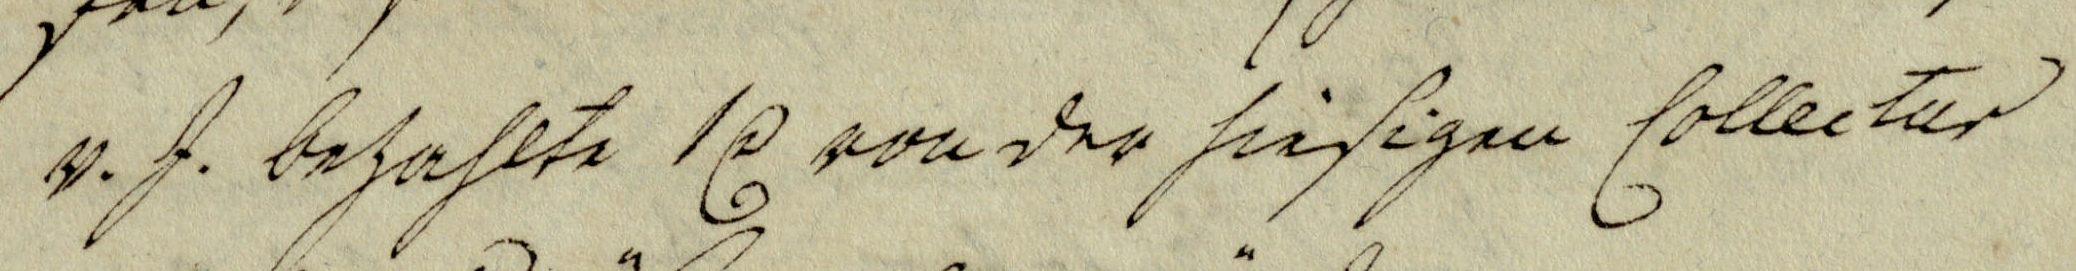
v. J. bezahlte 1 l. von der hiesigen Collectur
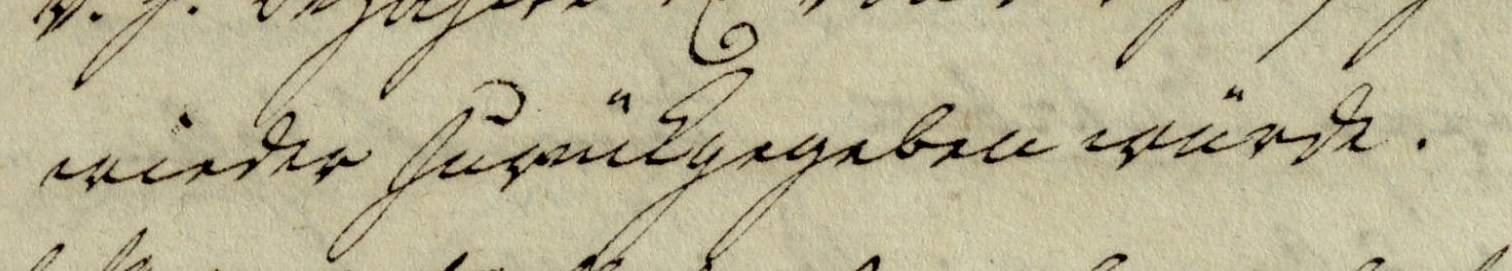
wieder zurückgegeben würde.
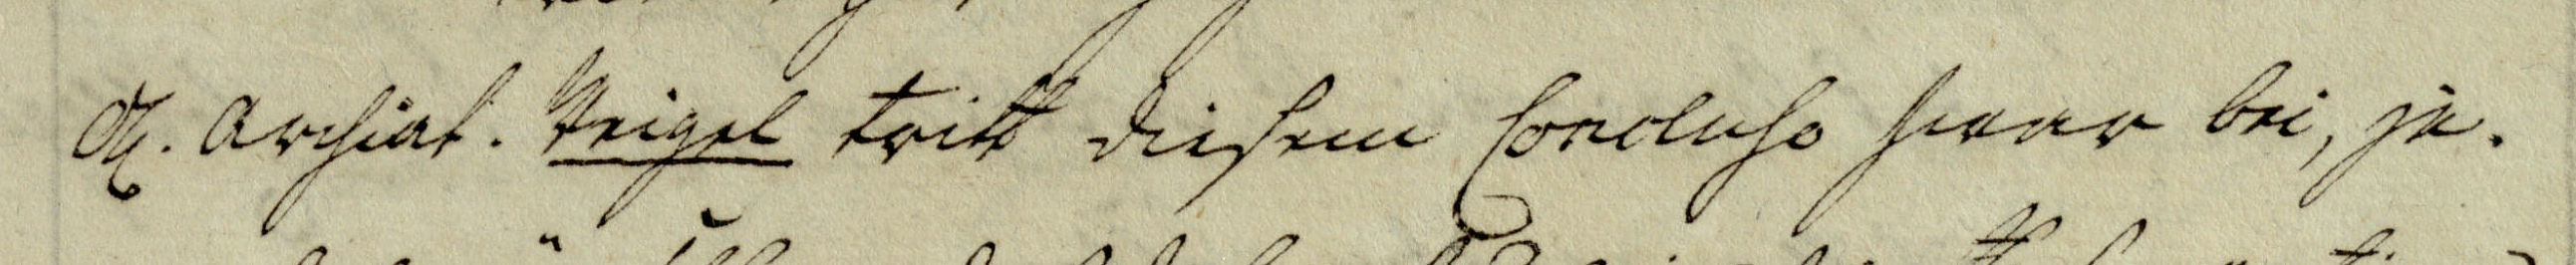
dh. Archiat. Weigel tritt diesem Concluso zwar bei, je¬
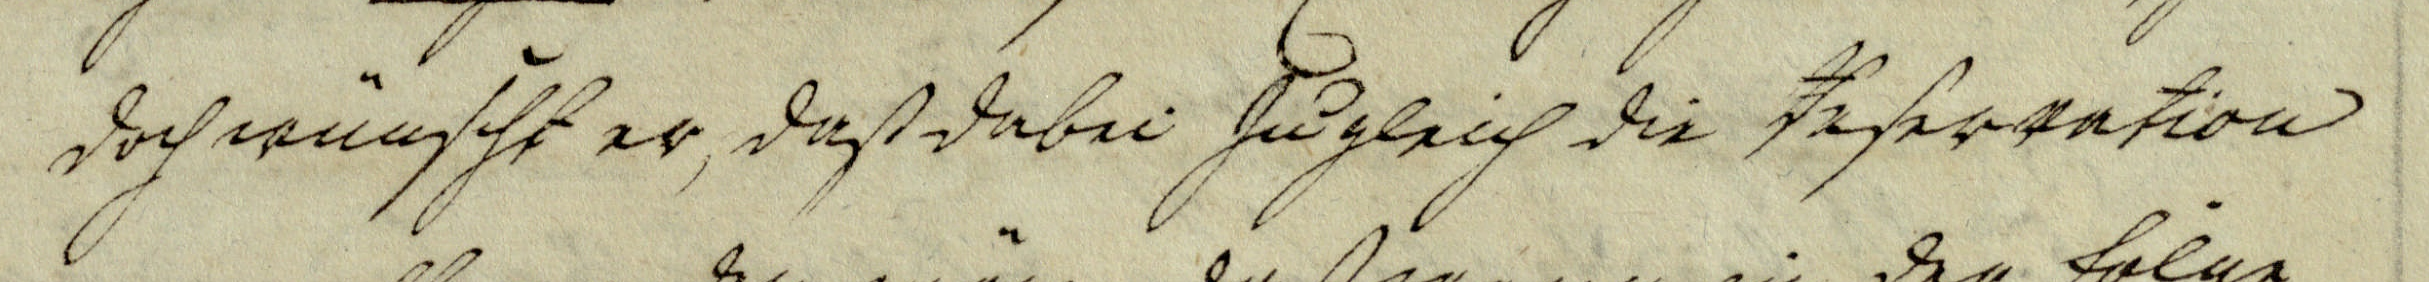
doch wünscht er, daß dabei zugleich die Reservation
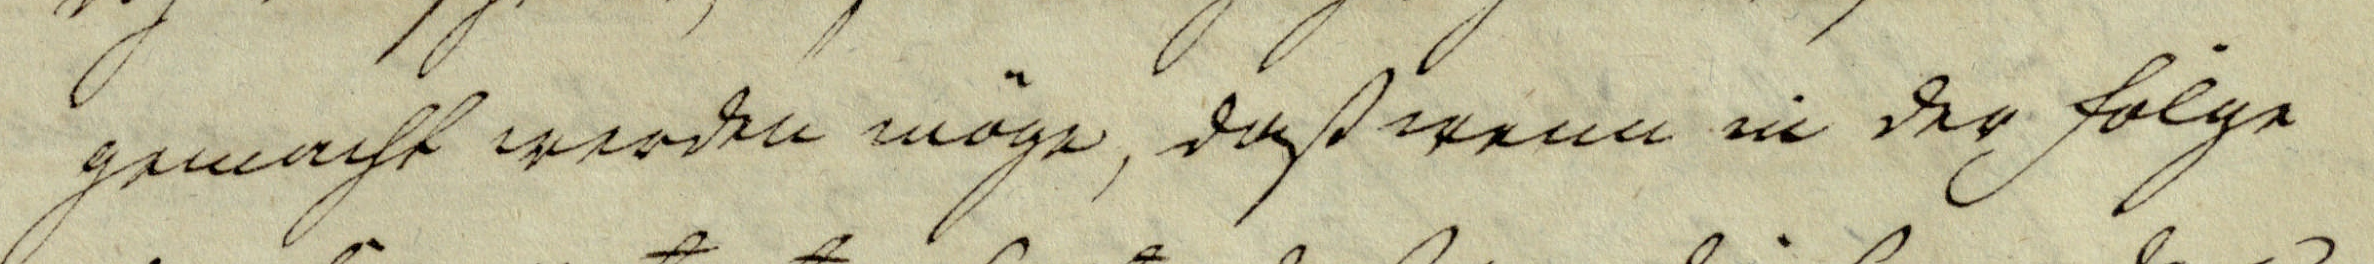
gemacht werden möge, daß wenn in der Folge
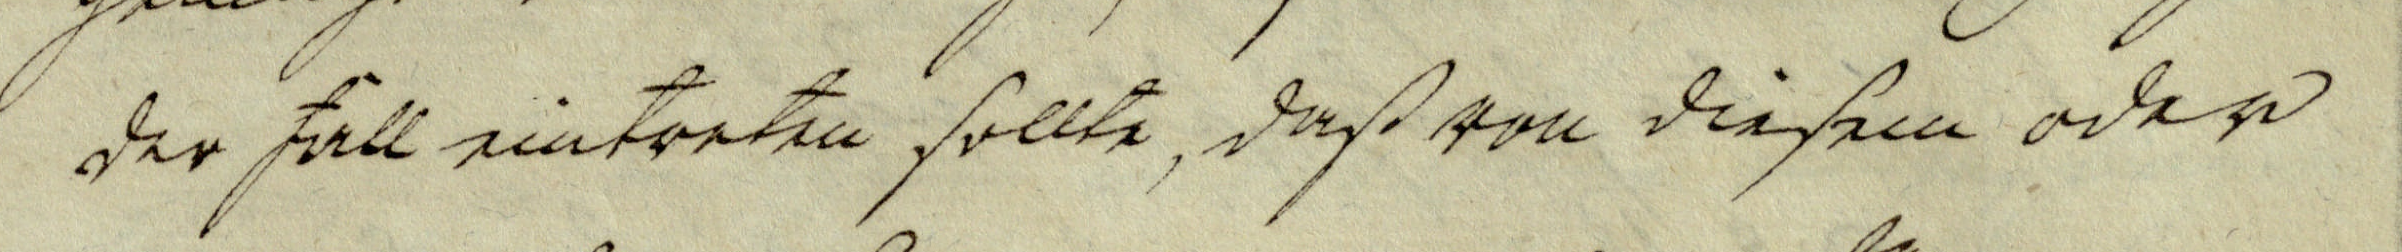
der Fall eintreten sollte, daß von diesem oder
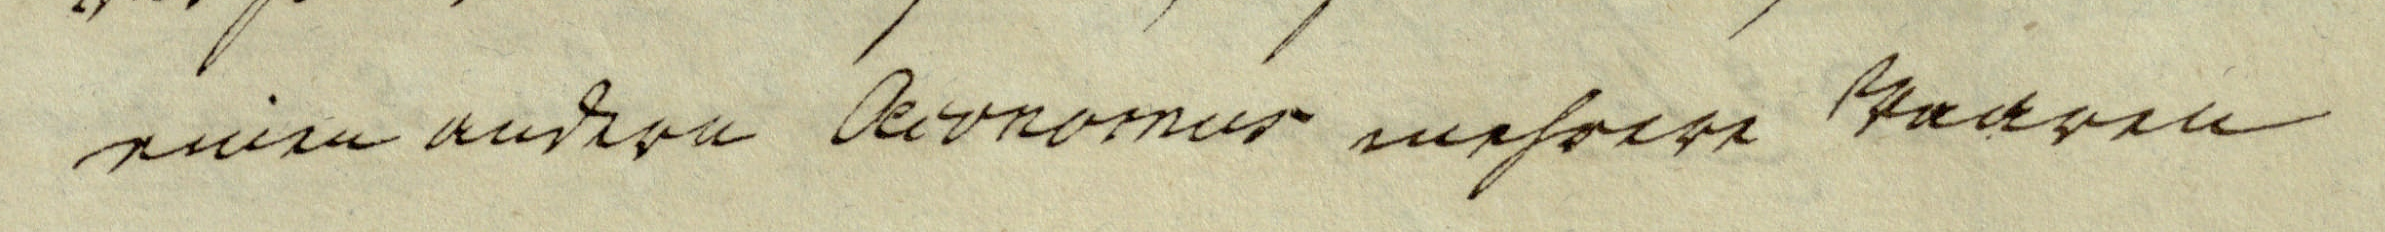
einen andern Oeconomus mehrere Waaren
